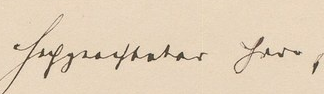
Hochgeachteter Herr,
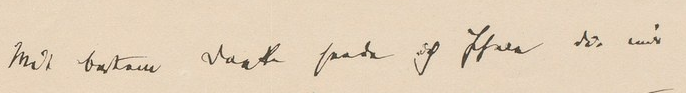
Mit bestem Dank sende ich Ihnen die mir
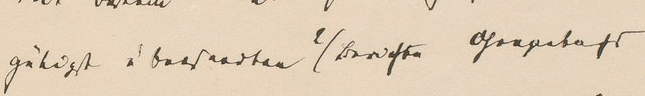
gütigst übersandten 2 Berichte Gonzenbachs
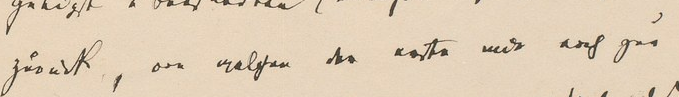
zurück, von welchen der erste mir noch zur
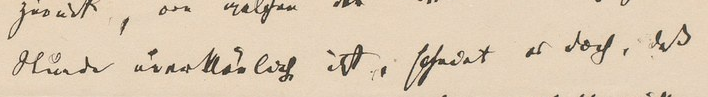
Stunde unerklärlich ist. Scheint es doch, daß
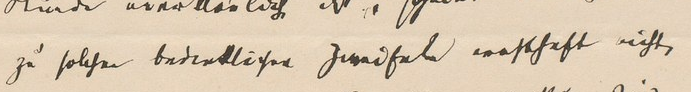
zu solchen bedenklichen Zweifeln ernsthaft nicht
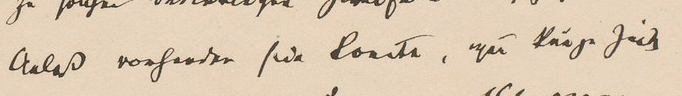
Anlaß vorhanden sein konnte, wenn kurze Zeit
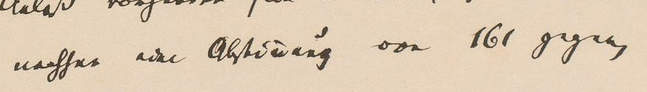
nachher eine Abstimmung von 161 gegen
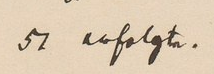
57 erfolgte.
